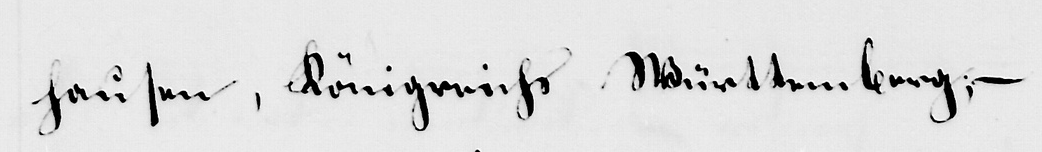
hausen, Königreichs Württemberg; –
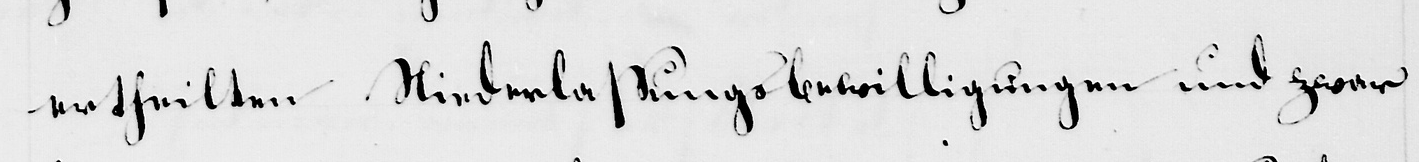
ertheilten Niederlaßungsbewilligungen und zwar
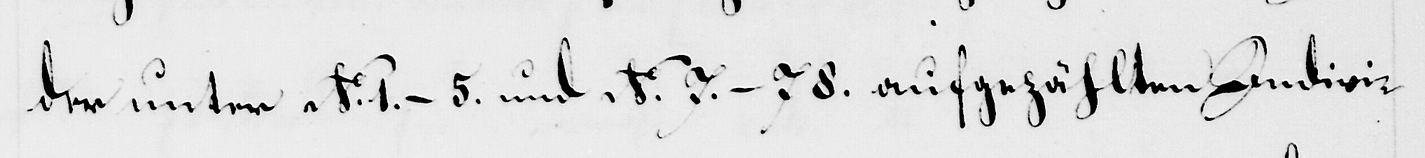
der unter N°. 1.–5. und N°. 7.–78. aufgezählten Indivi¬
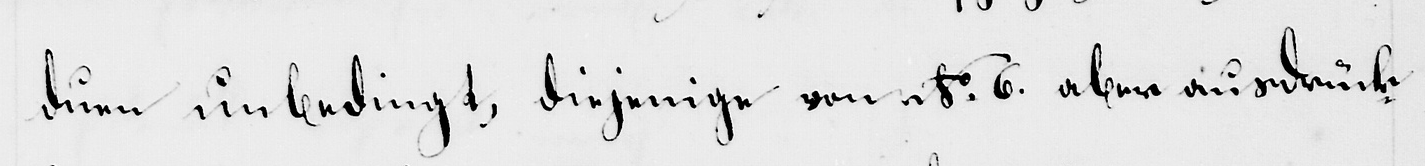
duen unbedingt, diejenige von N°. 6. aber ausdrück¬
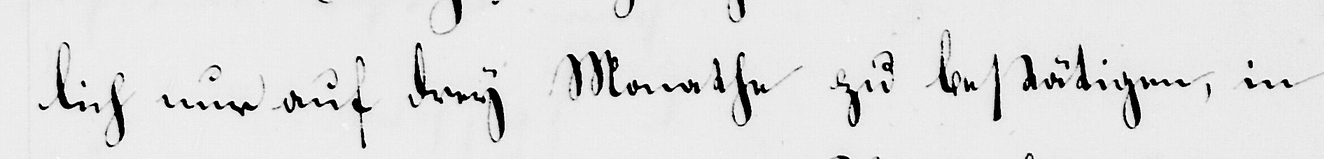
lich und auf drey Monathe zu bestätigen, in
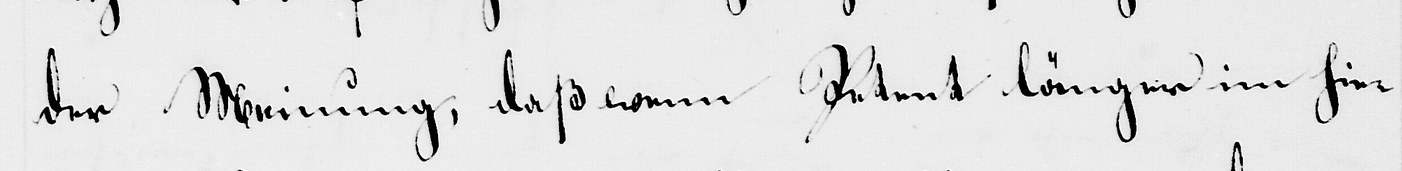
der Meinung, daß wenn Petent länger im hie¬
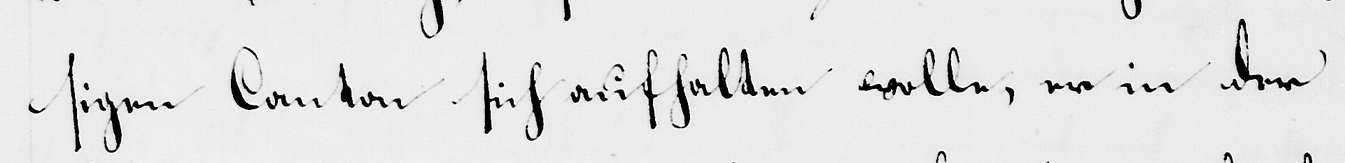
sigen Canton sich aufhalten wolle, er in der
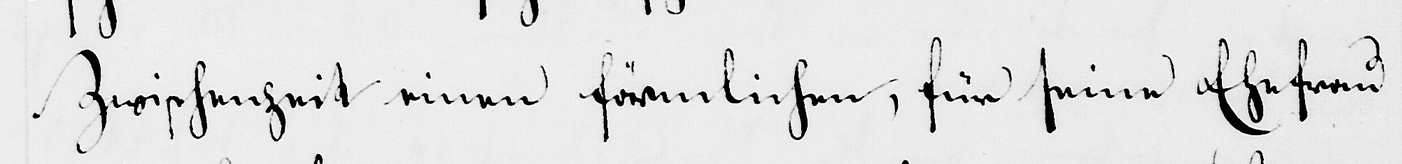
Zwischenzeit einen förmlichen, für seine Ehefrau
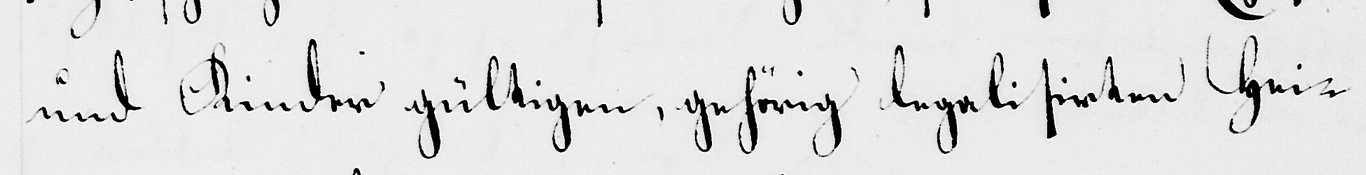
und Kinder gültigen, gehörig legalisirten Hei¬
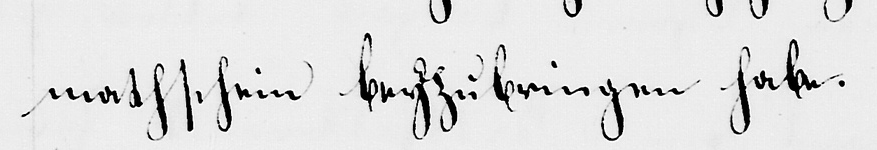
mathschein beyzubringen habe.
